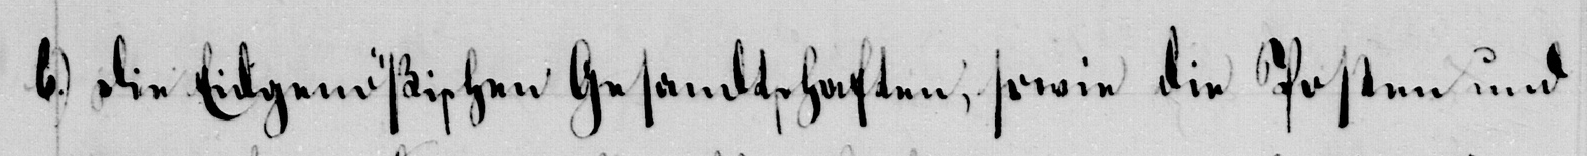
b.) Die Eidgenößische Gesandtschaften, sowie die Posten und
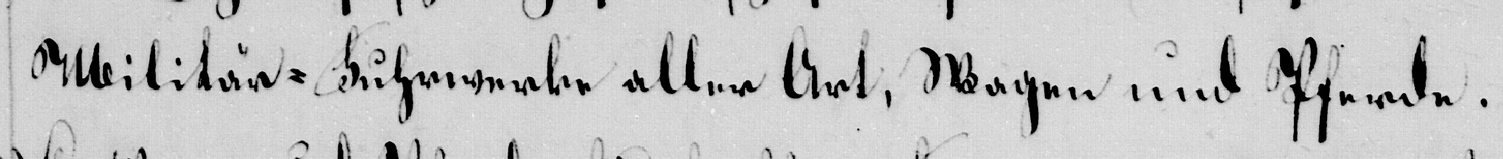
Militär-Fuhrwerke aller Art, Wagen und Pferde.
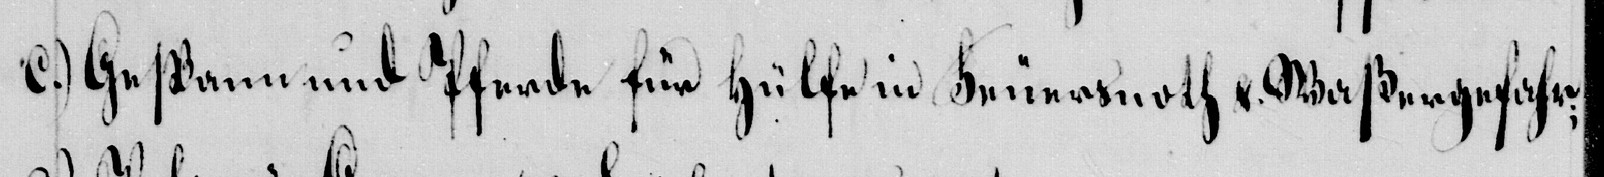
c.) Gespann und Pferde für Hülfe in Feuersnoth & Waßergefahr;
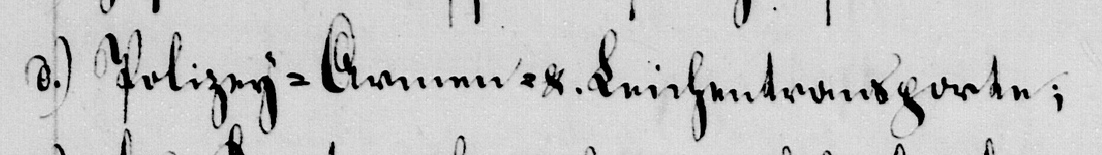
d.) Polizey- Armee- &. Leichentransporte;
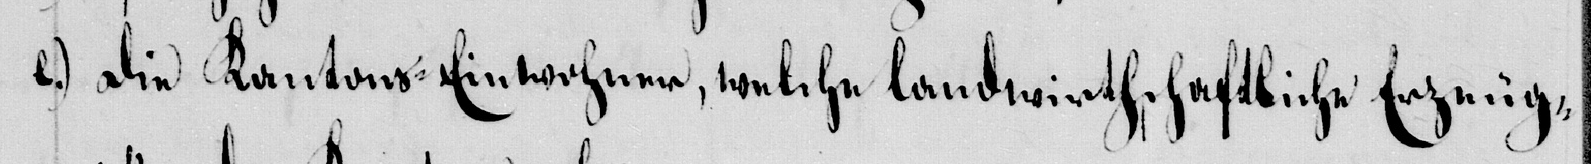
e.) Die Kantons-Einwohner, welche landwirthschaftliche Erzeug¬
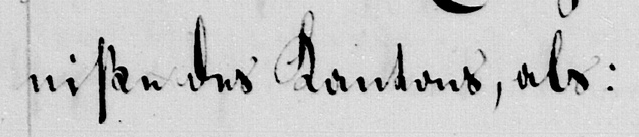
niße des Kantons, als:
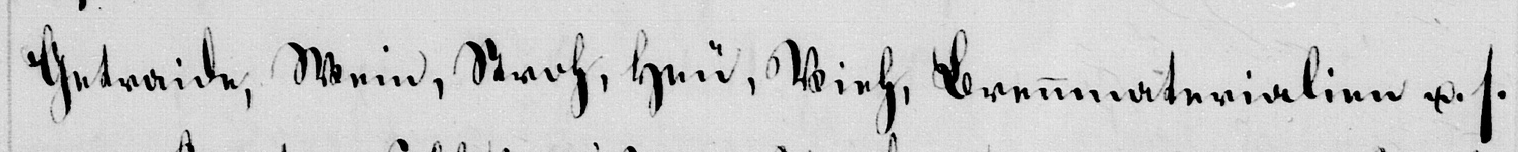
Getraide, Wein, Stroh, Heu, Vieh, Brennmaterialien, u. s.
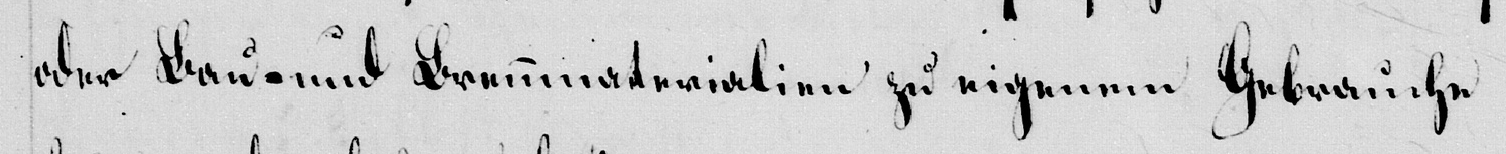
oder Bau- und Brennmaterialien zu eigenem Gebrauche
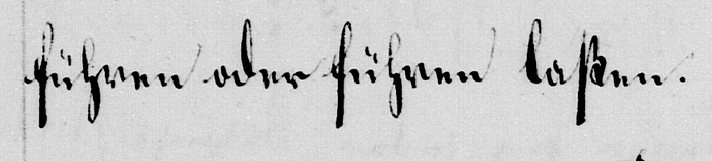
führen oder führen lassen.
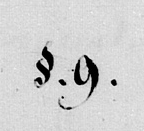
§. 9.
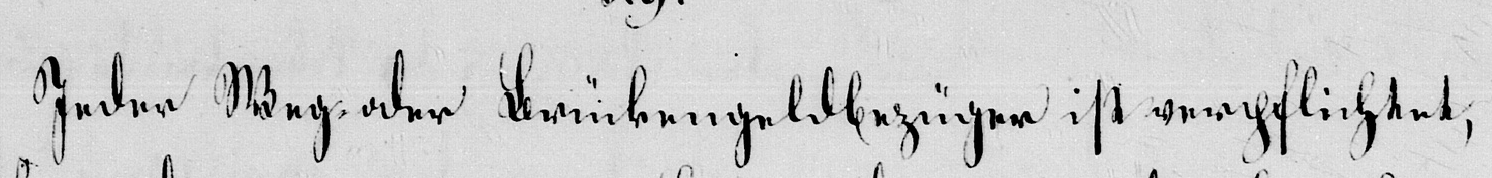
Jeder Weg- oder Brückengeldbezüger ist verpflichtet,
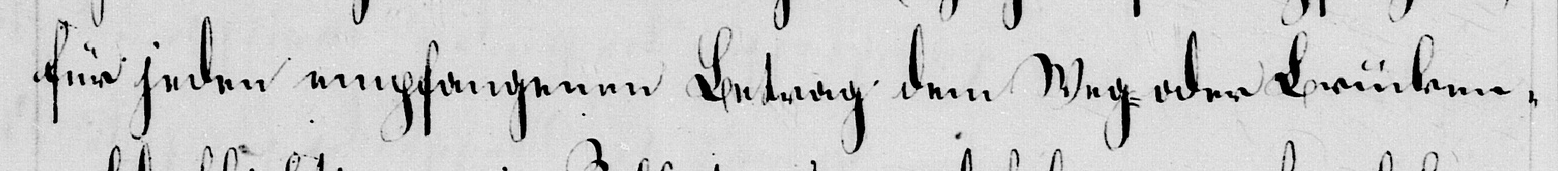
für jeden empfangenen Betrag dem Weg oder Brücken¬
